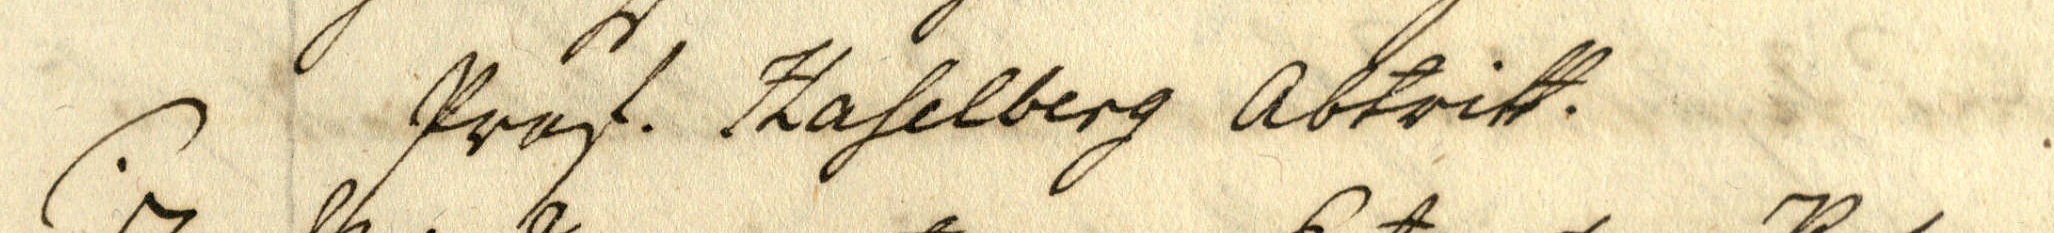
Prof. Haselberg Abtritt.
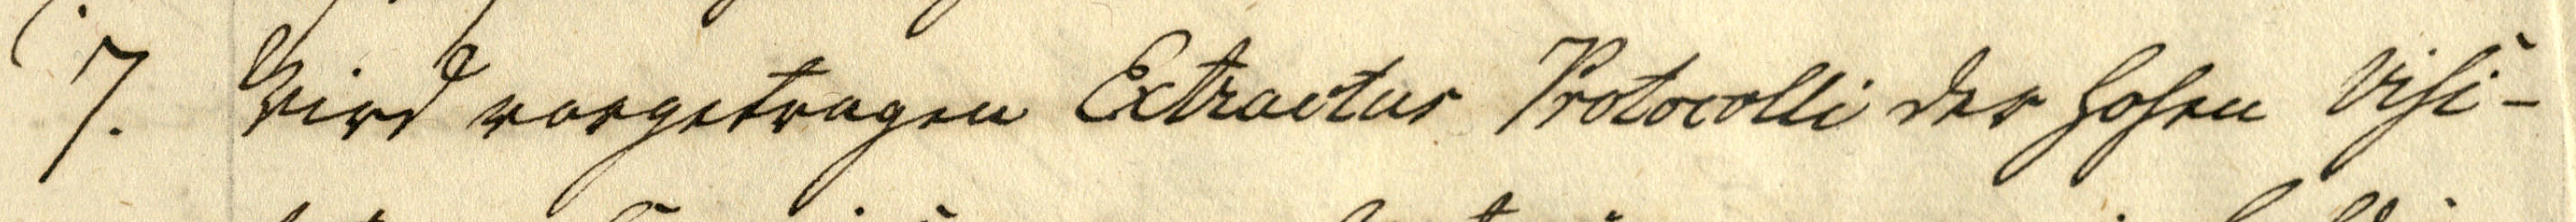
7. Wird vorgetragen Extractus Protocolli der hohen Visi-
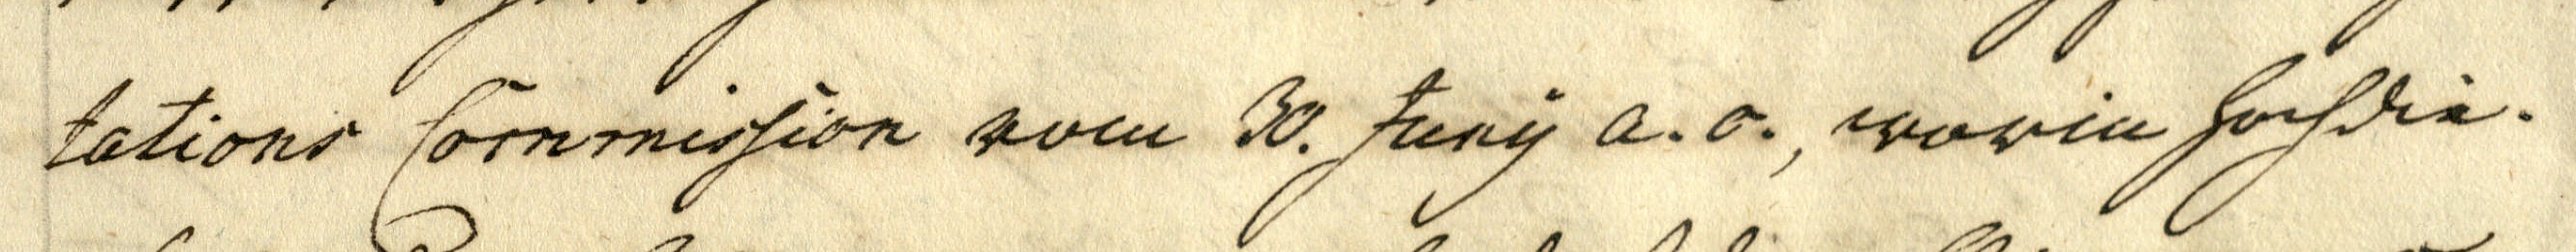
tations Commission vom 30. Juny a. c., worin hochdie-
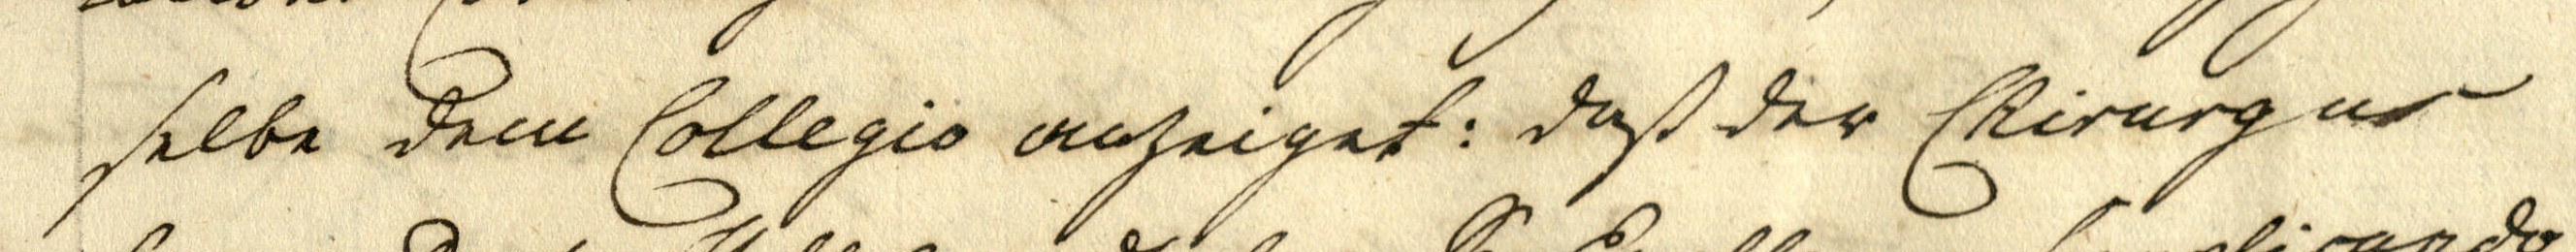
selbe dem Collegio anzeiget: daß der Chirurgus
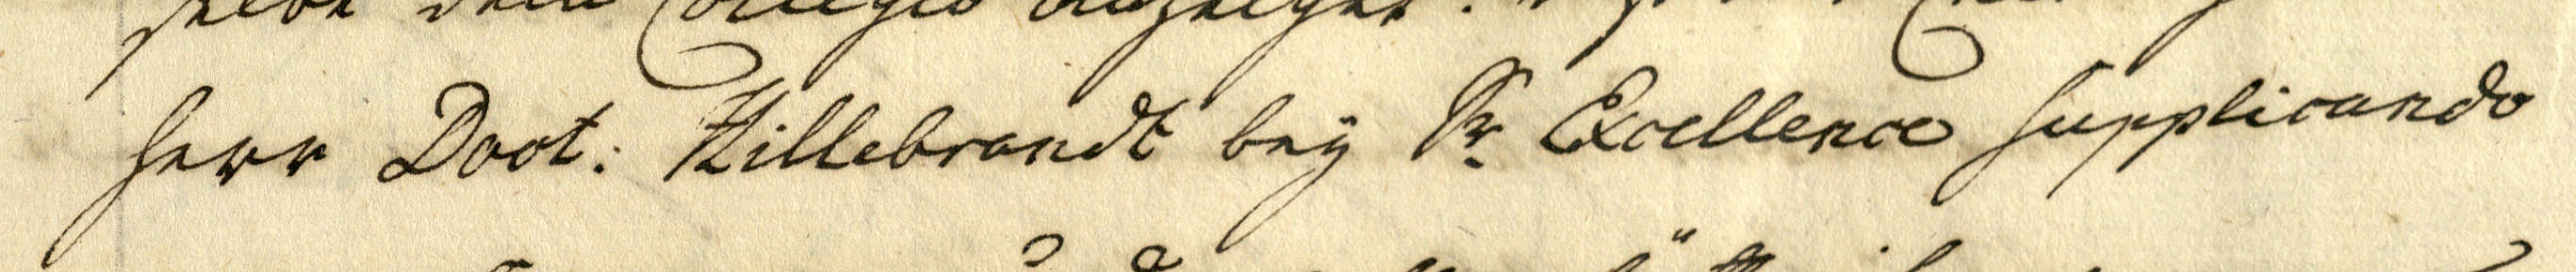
Herr Doct. Hillebrandt bey Sr. Excellence supplicando
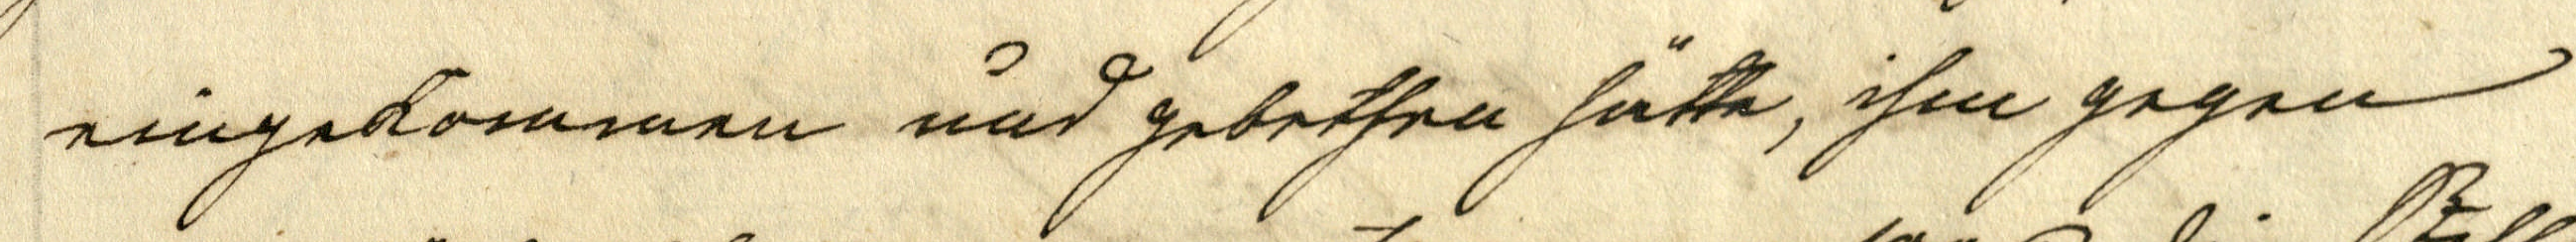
eingekommen und gebethen hätte, ihm gegen
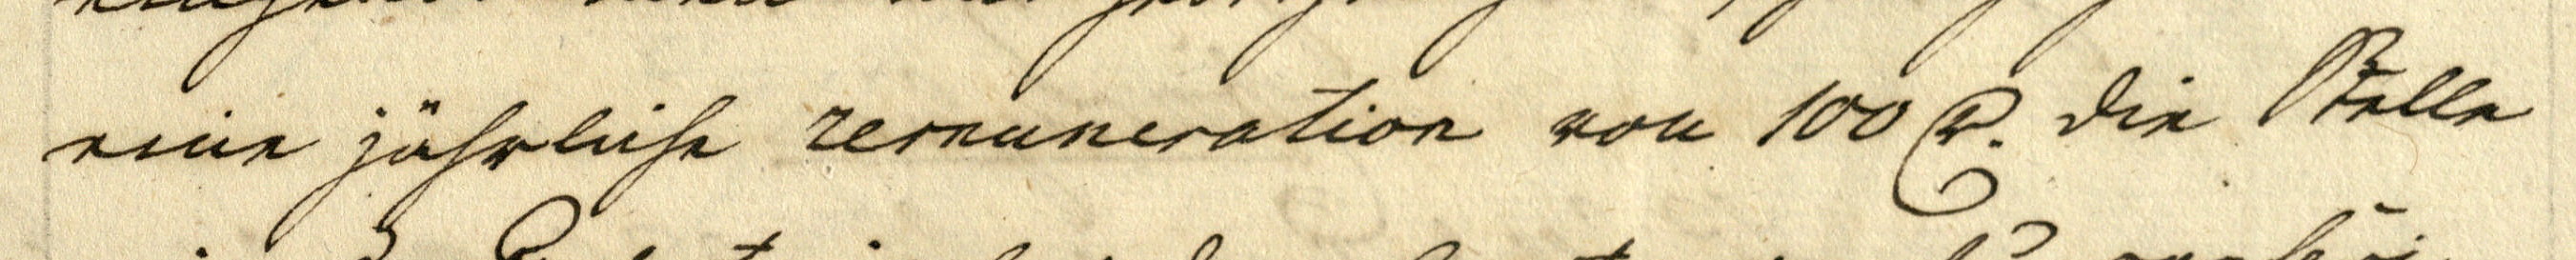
eine jährliche remuneration von 100 rtl die Stelle
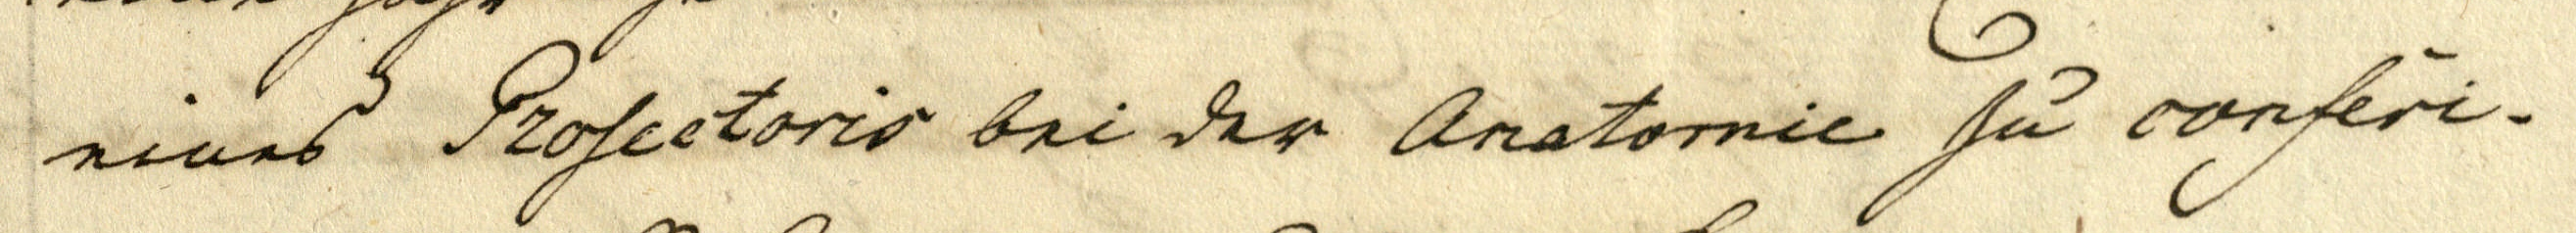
eines Prosectoris bei der Anatomie zu conferi-
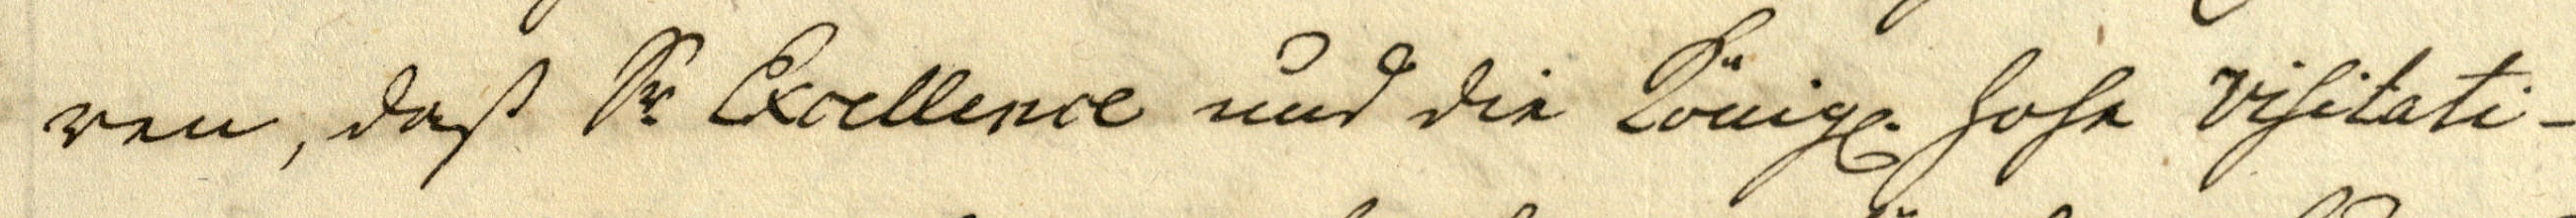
ren, daß Sr. Excellence und die Königl. hohe Visitati-
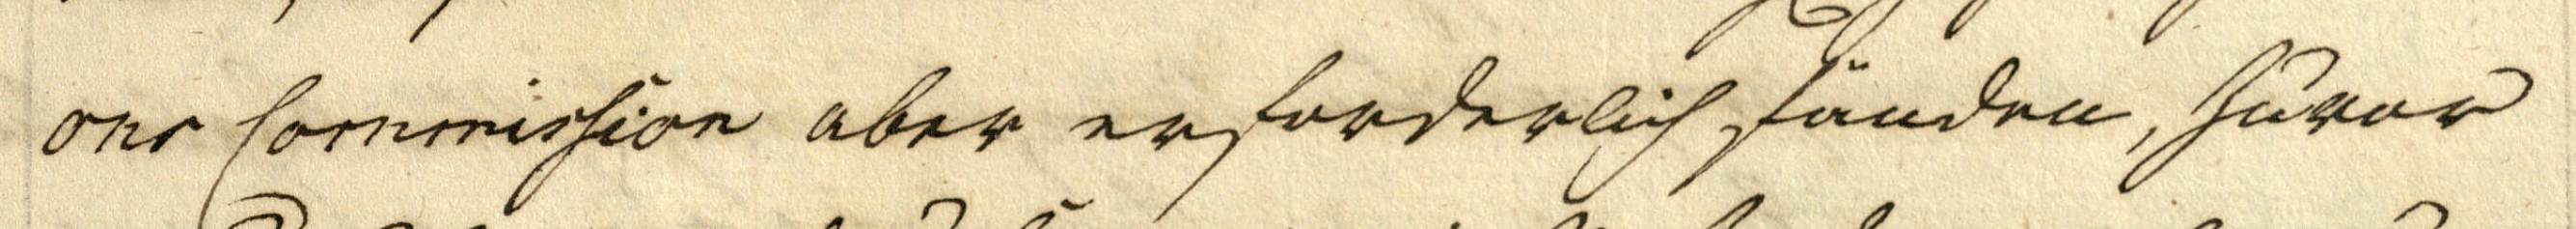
ons Commission aber erforderlich fänden, zuvor
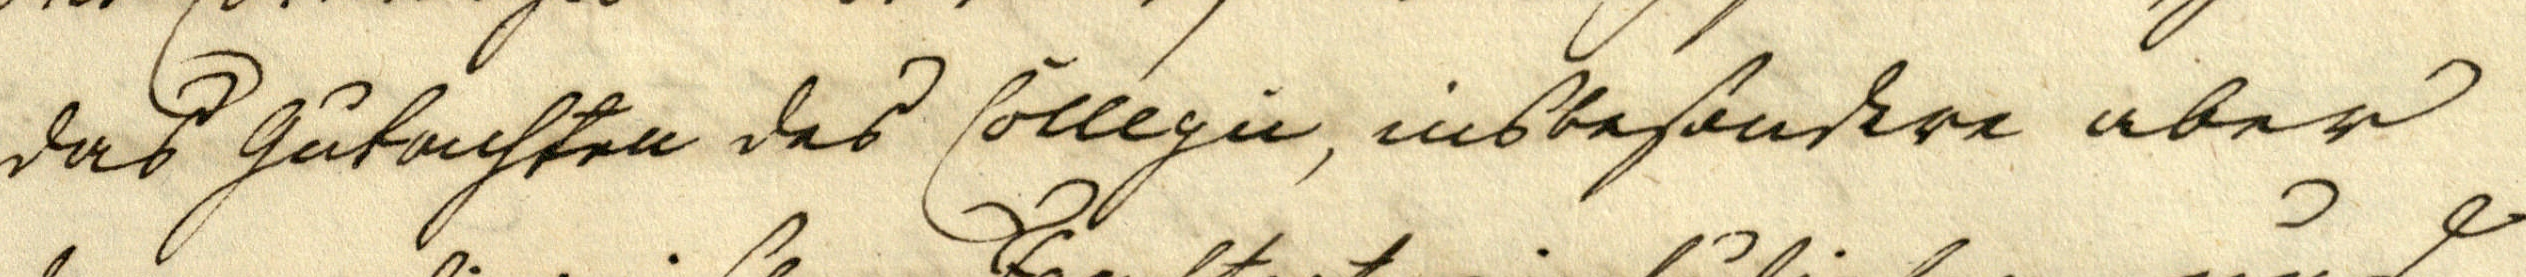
das Guthachten des Collegii, insbesondere aber
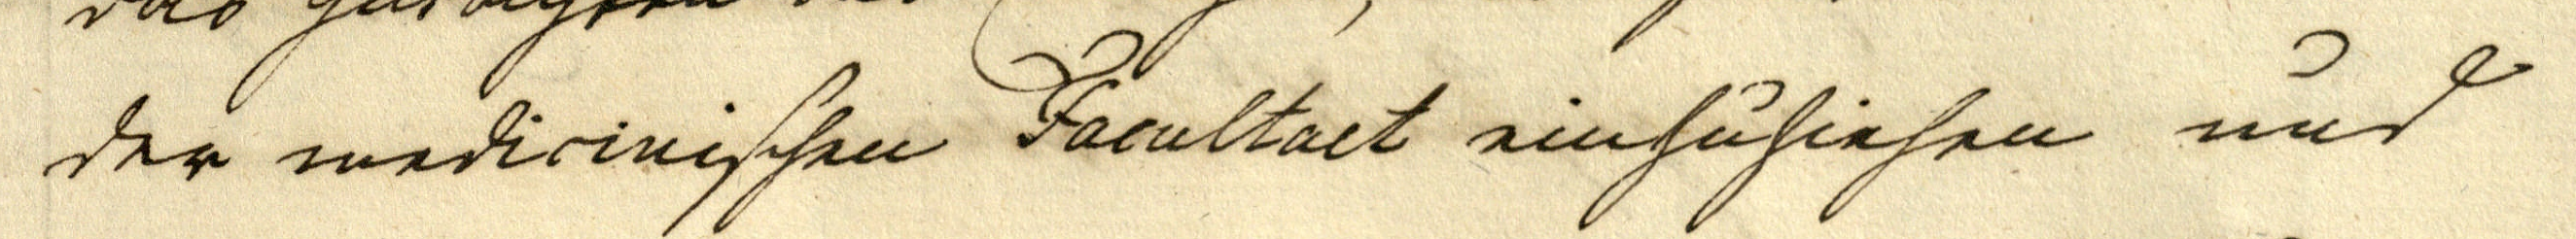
der medicinischen Facultaet einzuziehen und
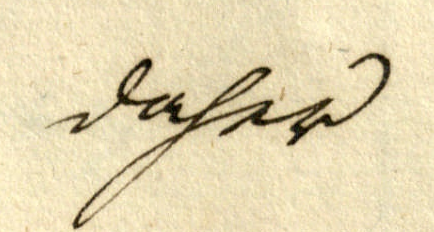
daher
